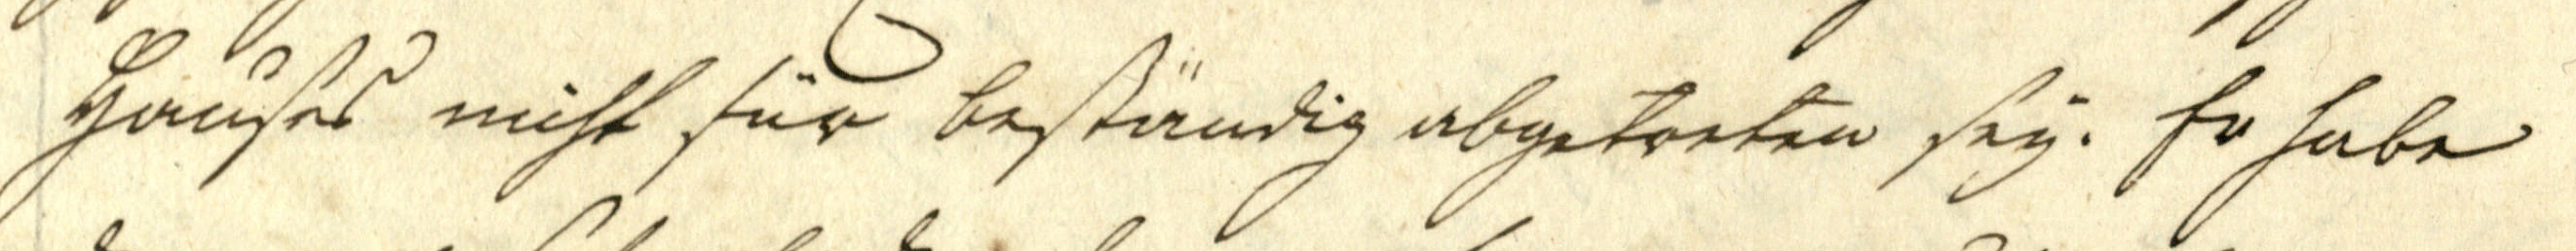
Hauses nicht für beständig abgetreten seÿ. Er habe
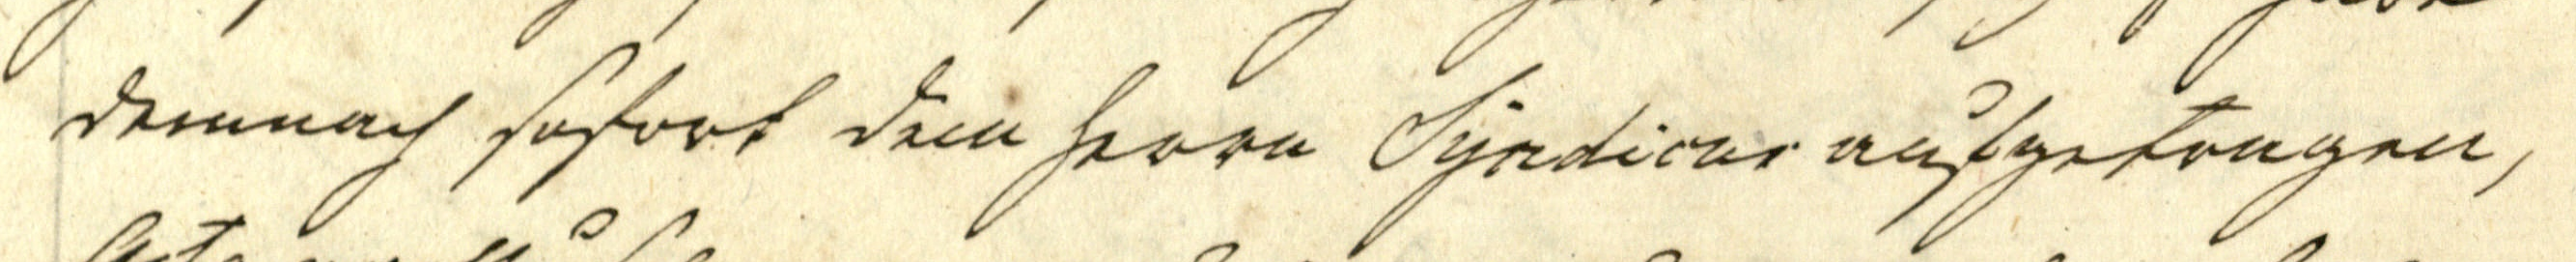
demnach sofort dem herrn Sÿndicus aufgetragen,
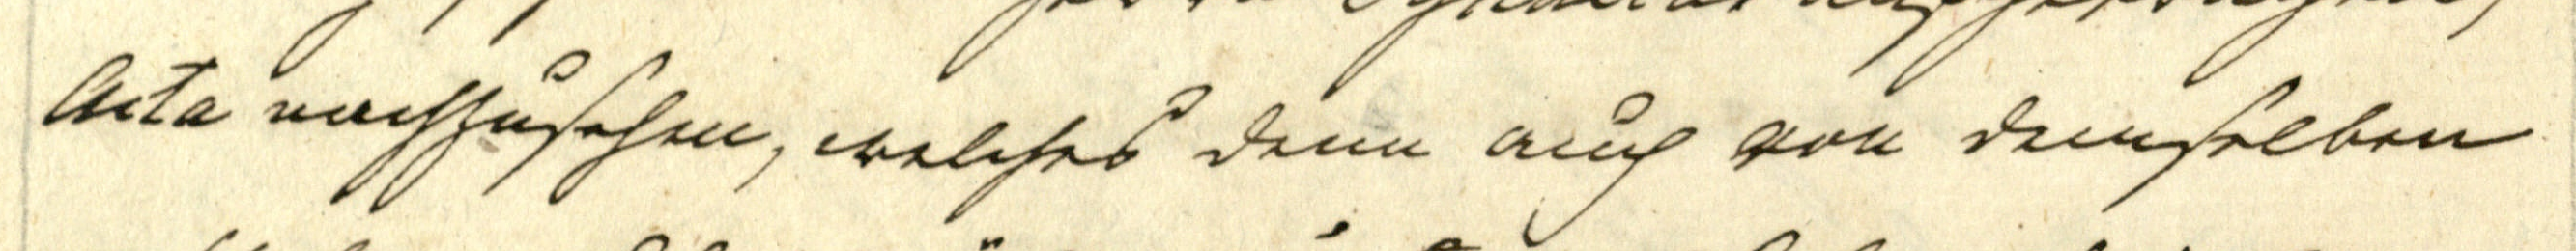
Acta nachzusehen, welches denn auch von demselben
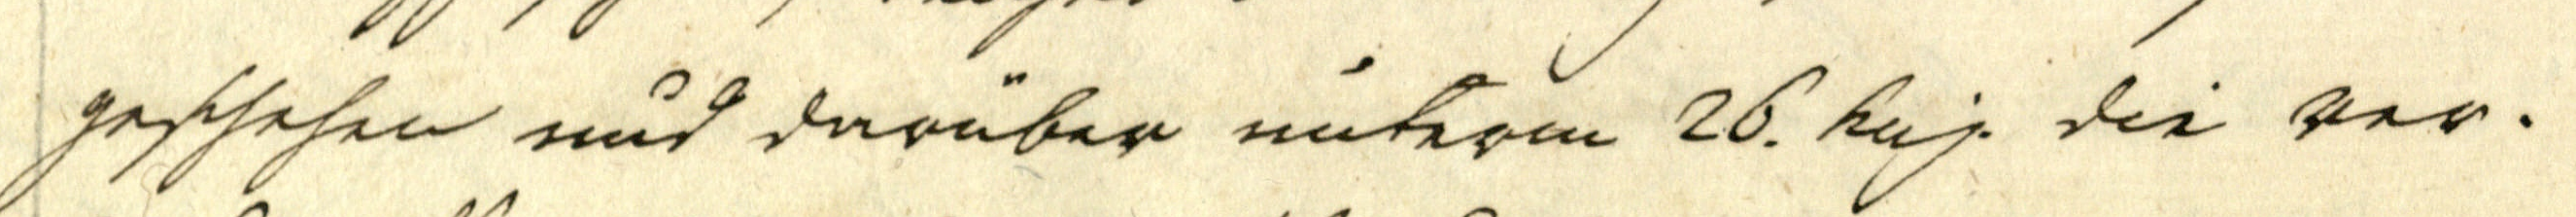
geschehen und darüber unterm 26. huj. die ver¬
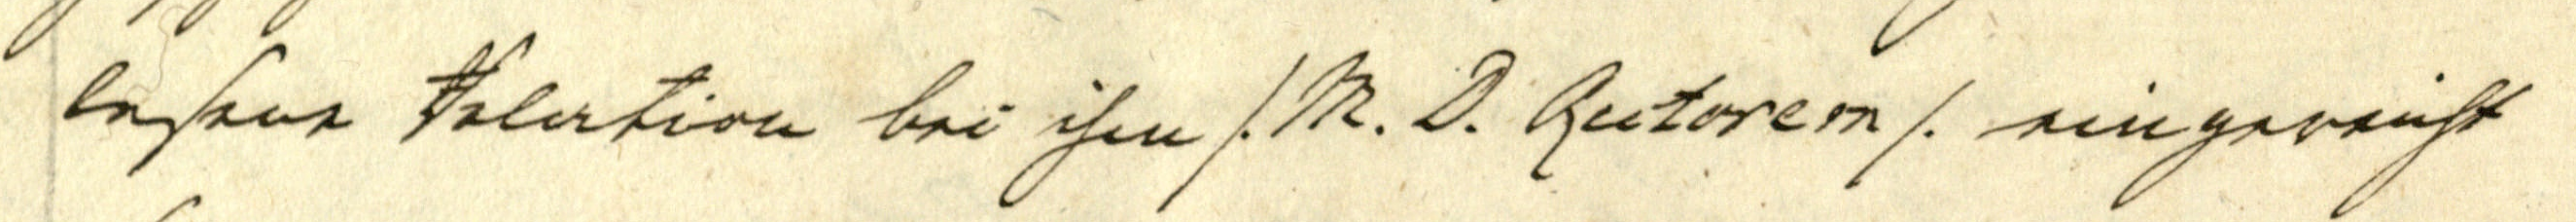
lesene Relation bei ihm / M. D. Rectorem / eingereicht
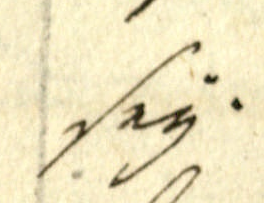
seÿ.
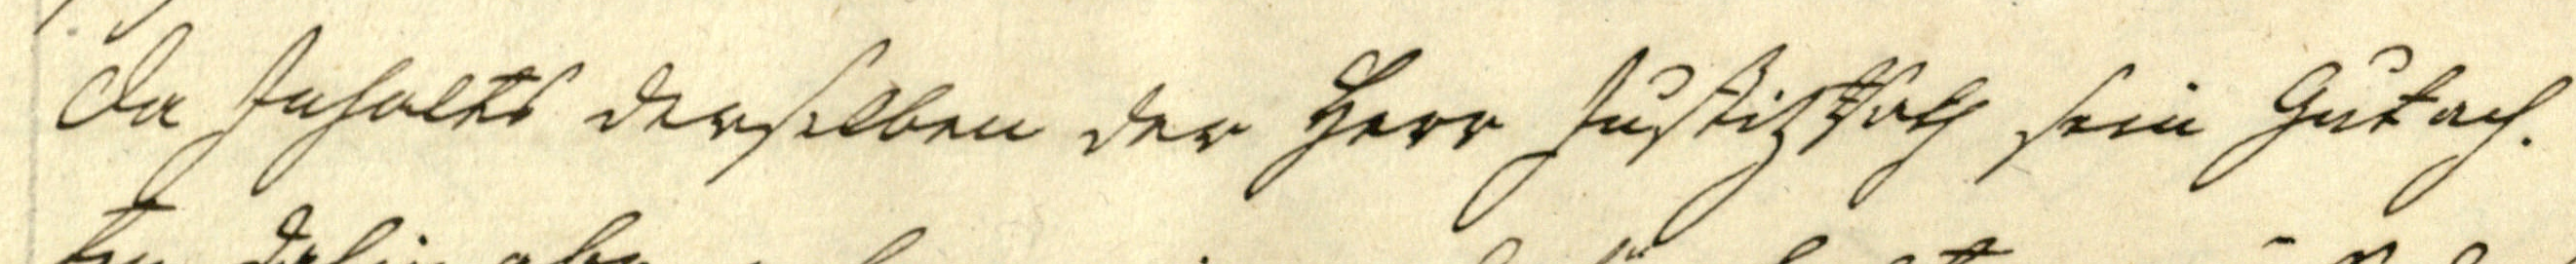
Da Inhalts derselben der Herr Justiz Rath sein Gutach¬
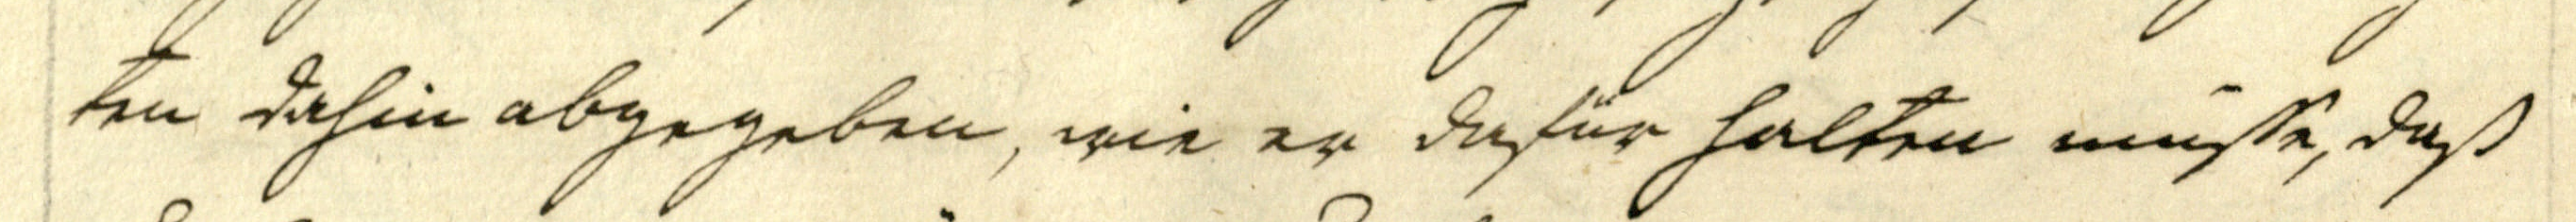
ten dahin abgegeben, wie er dafür halten müsse, daß
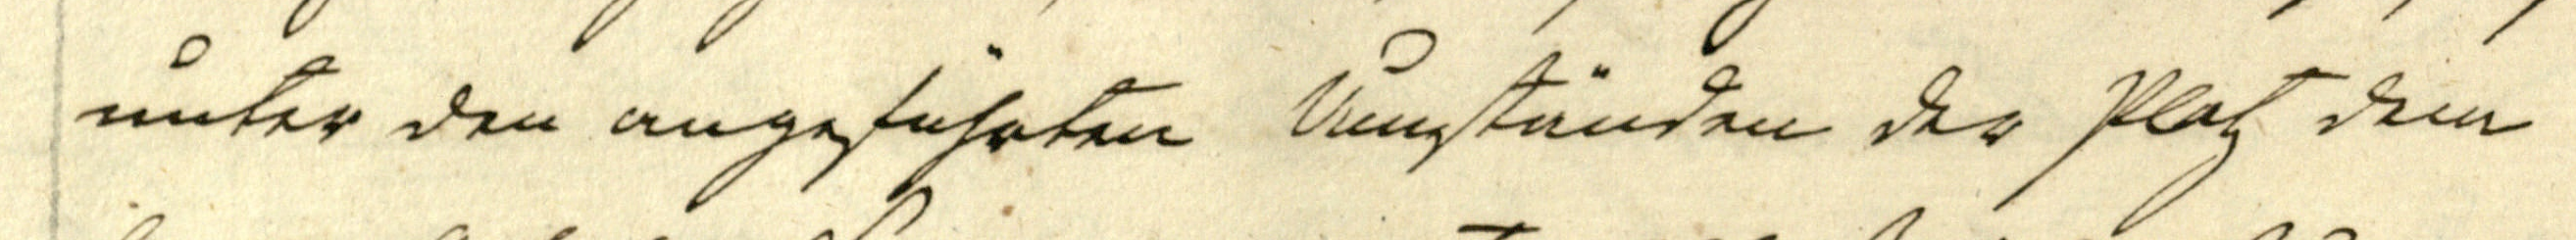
unter den angeführten Umständen der Platz dem
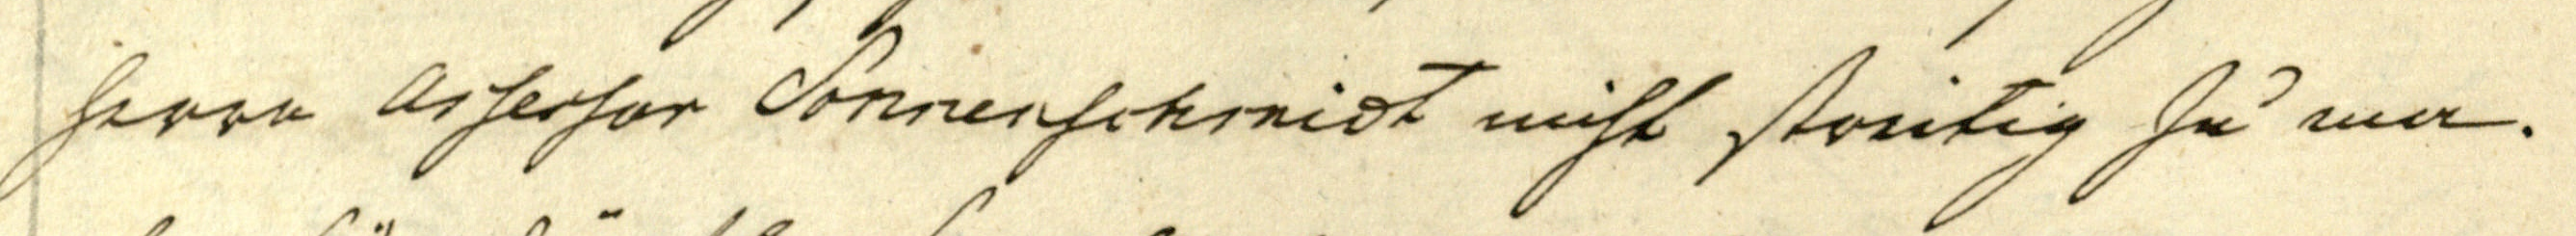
herrn Assessor Sonnenschmidt nicht streitig zu ma¬
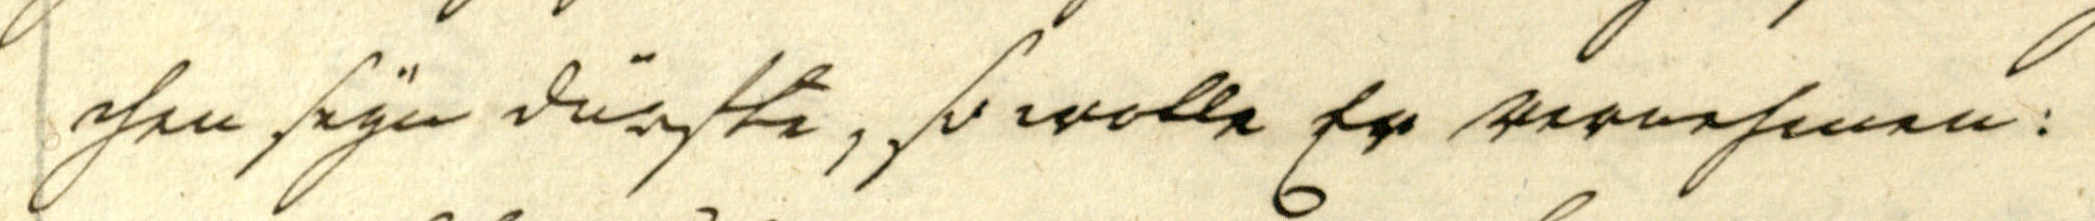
chen seÿn dürfte, so wolle Er vernehmen:
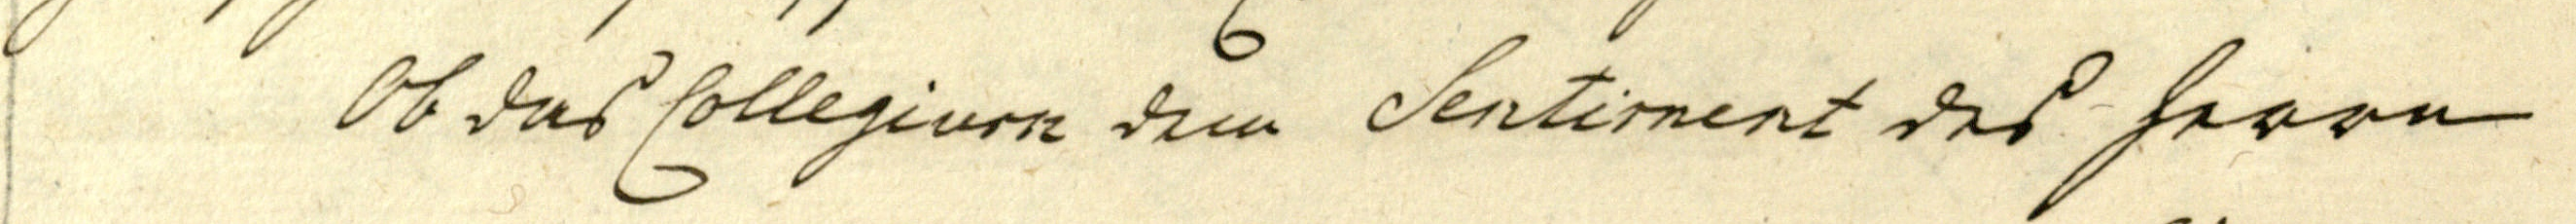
Ob das Collegium dem Sentiment des herrn
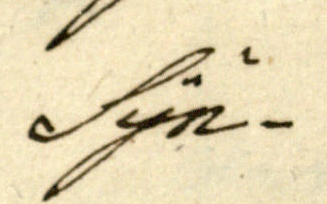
Sÿn
